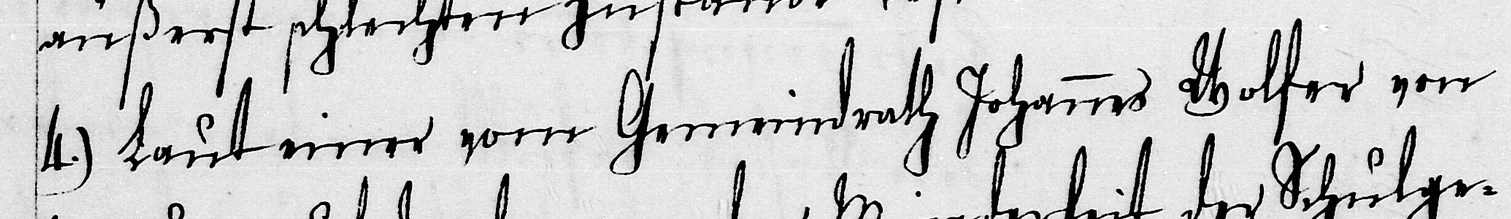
4.) Laut einer vom Gemeindrath Johannes Wolfer von
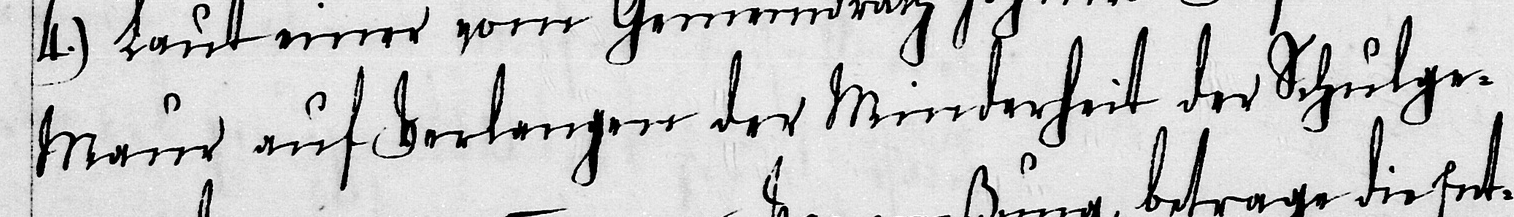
Maur auf Verlangen der Minderheit der Schulge¬
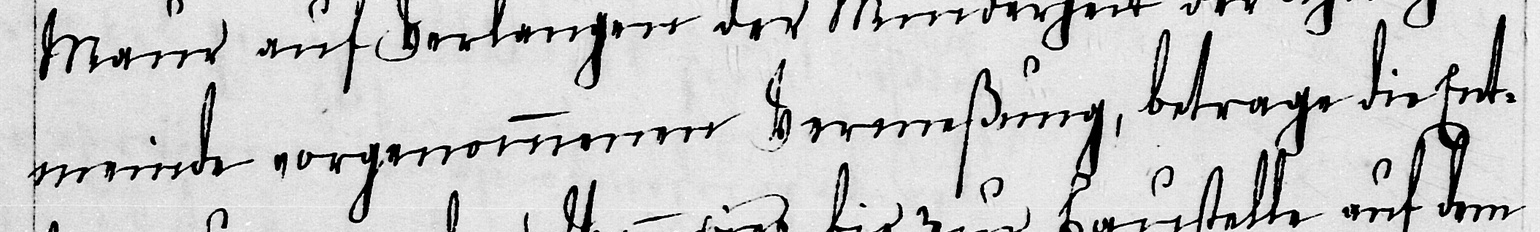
meinde vorgenommenen Vermeßung, betrage die Ent¬
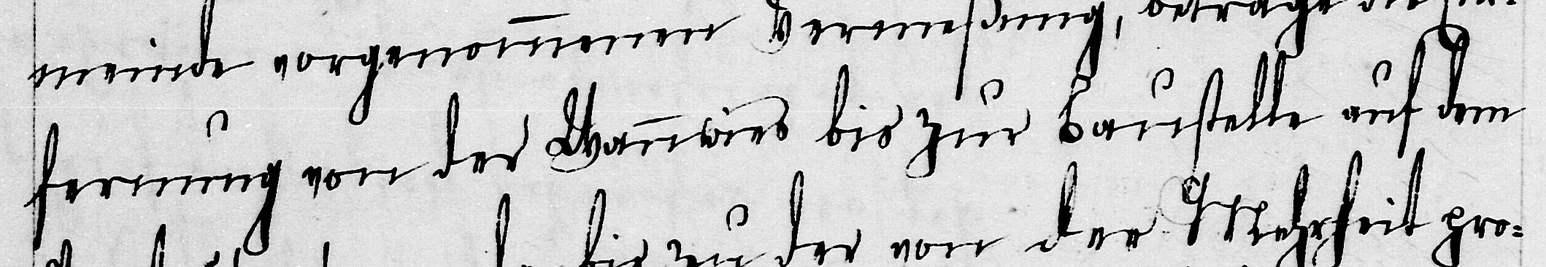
fernung von der Wannwies bis zur Baustelle auf dem
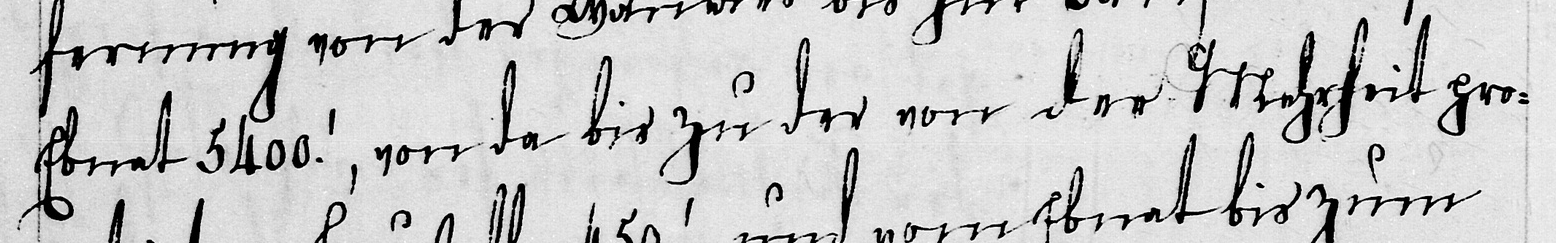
Ebnat 5400.‘, von da bis zu der von der Mehrheit pro¬
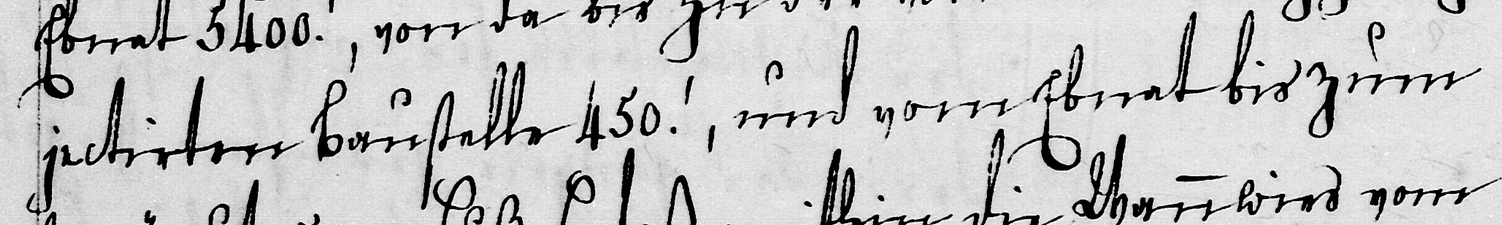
jectirten Baustelle 450.‘, und vom Ebnat bis zum
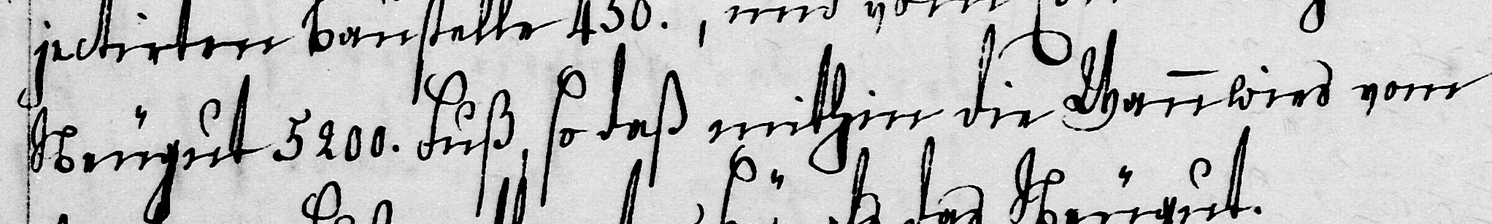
Neugut 5200. Fuß, so daß mithin die Wannwies vom
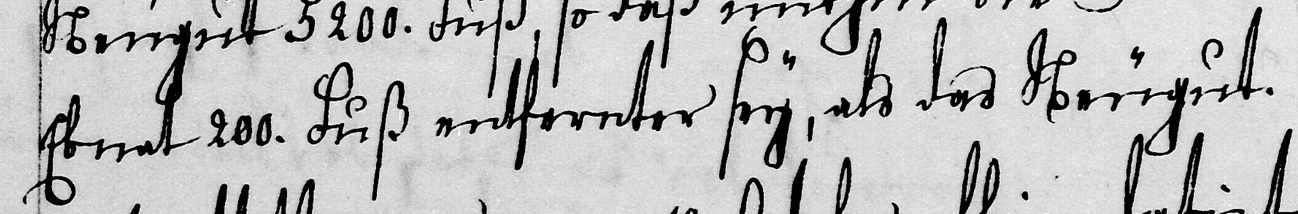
Ebnat 200. Fuß entfernter sey, als das Neugut.
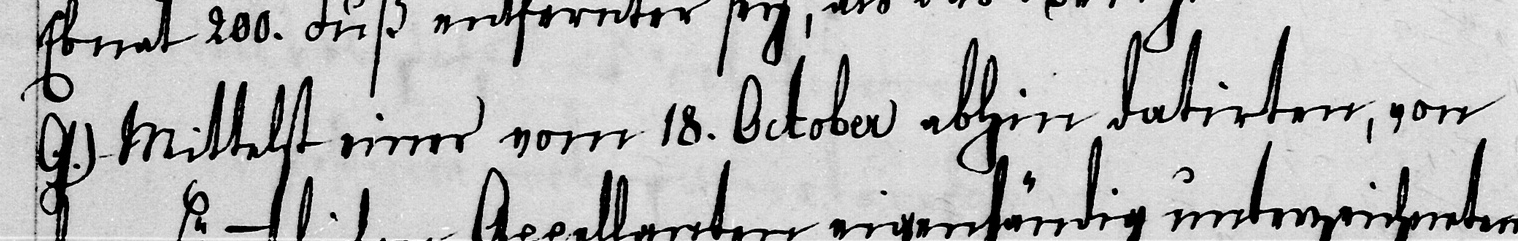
G.) Mittelst einer vom 18. October abhin datirten, von
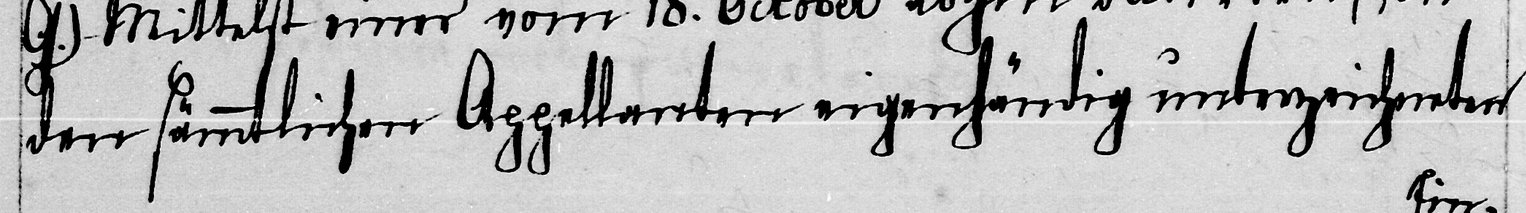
den sämmtlichen Appellanten eigenhändig unterzeichneten
